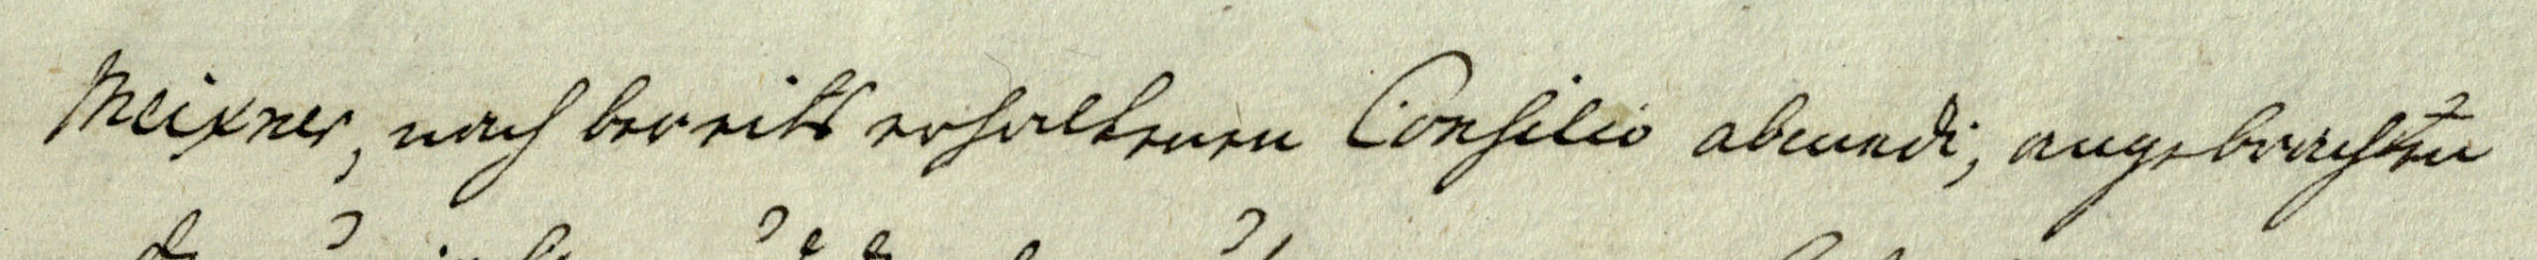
Meixner, nach bereits erhaltenen Consilio abeundi; angebrachten
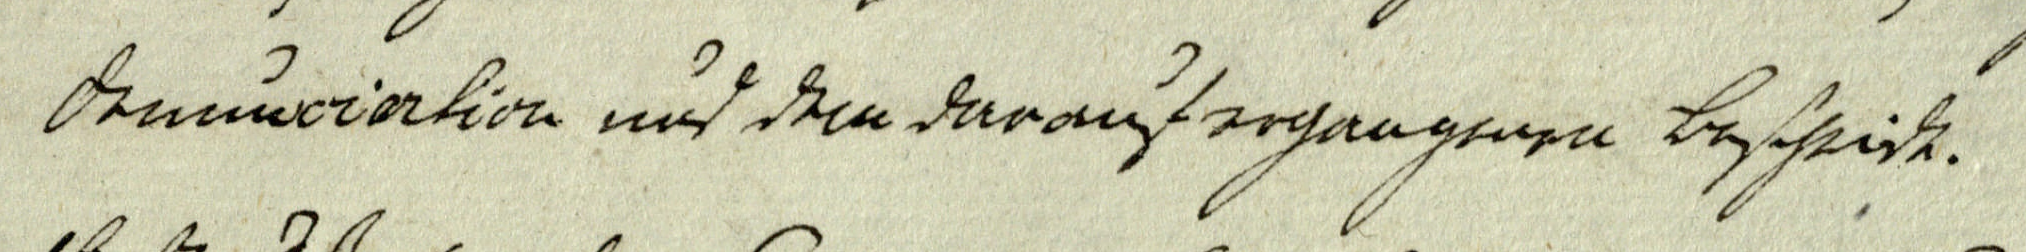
Denunciation und dem darauf ergangenen Bescheide.
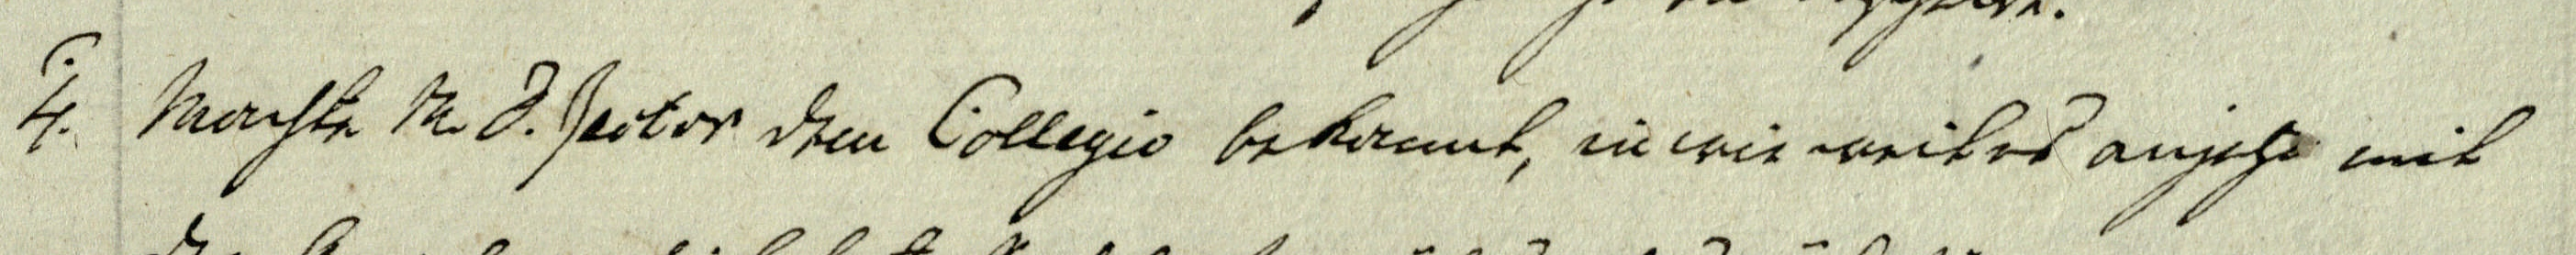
4. Machte M. D. Rector dem Collegio bekannt, in wieweit es anjetzo mit
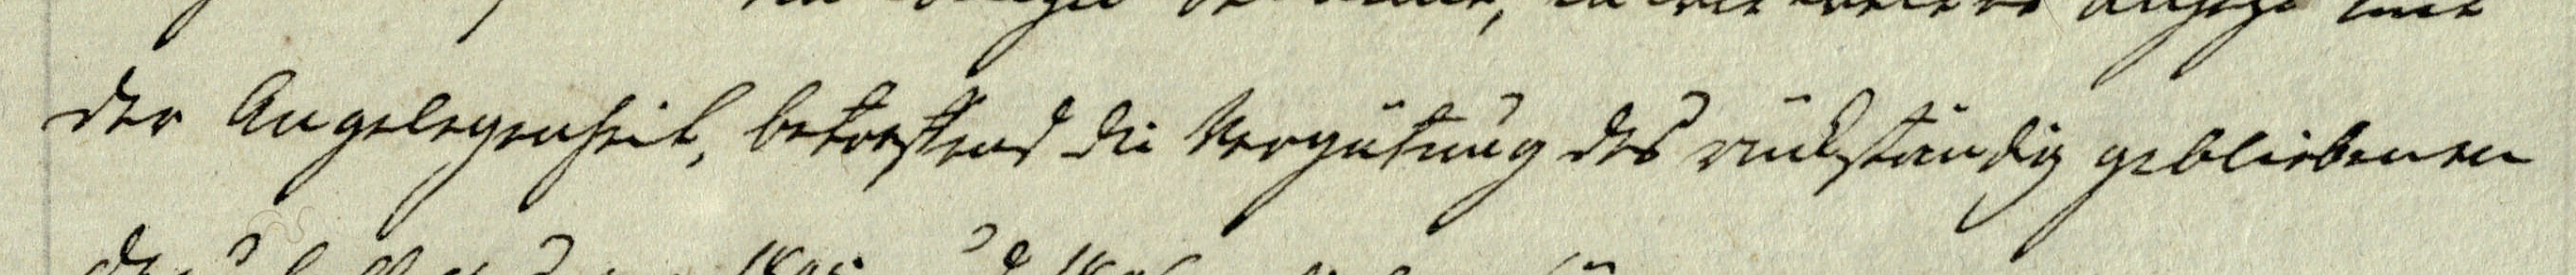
der Angelegenheit, betreffend die Vergütung des rückständig gebliebenen
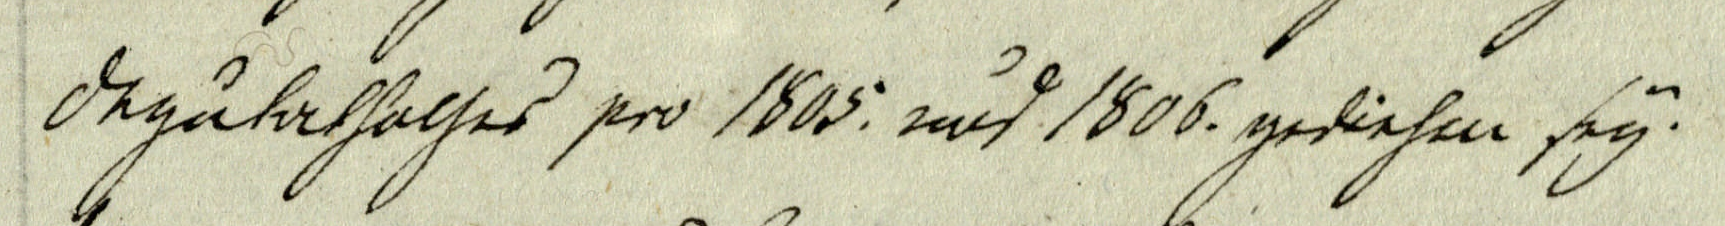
Deputatholzes pro 1805. und 1806. gediehen seÿ.
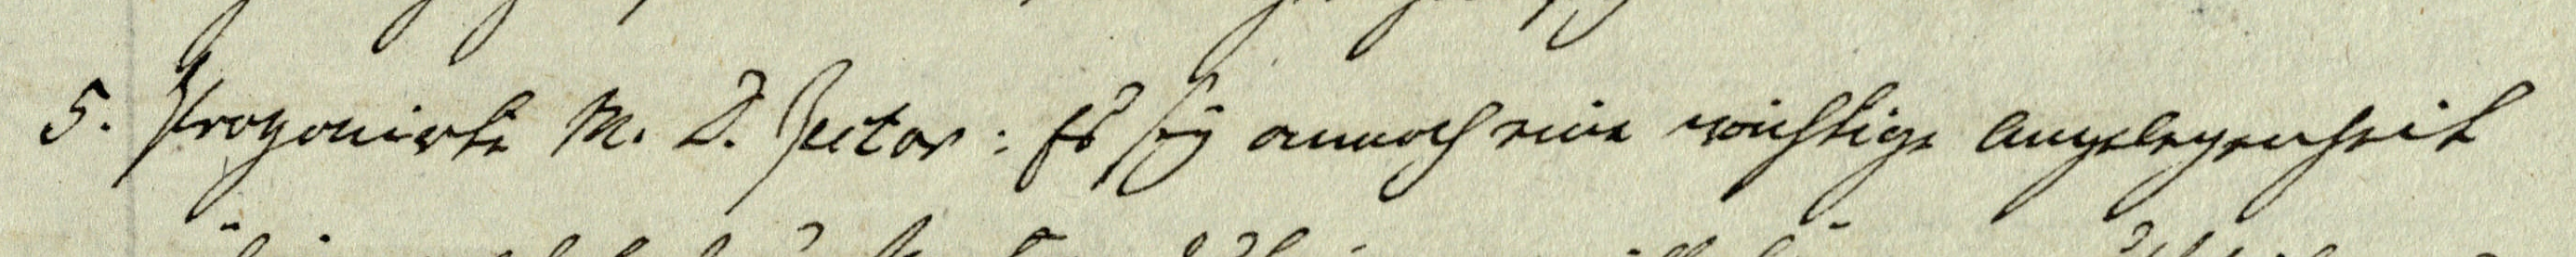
5. Proponirte M. D. Rector: Es seÿ annoch eine wichtige Angelegenheit
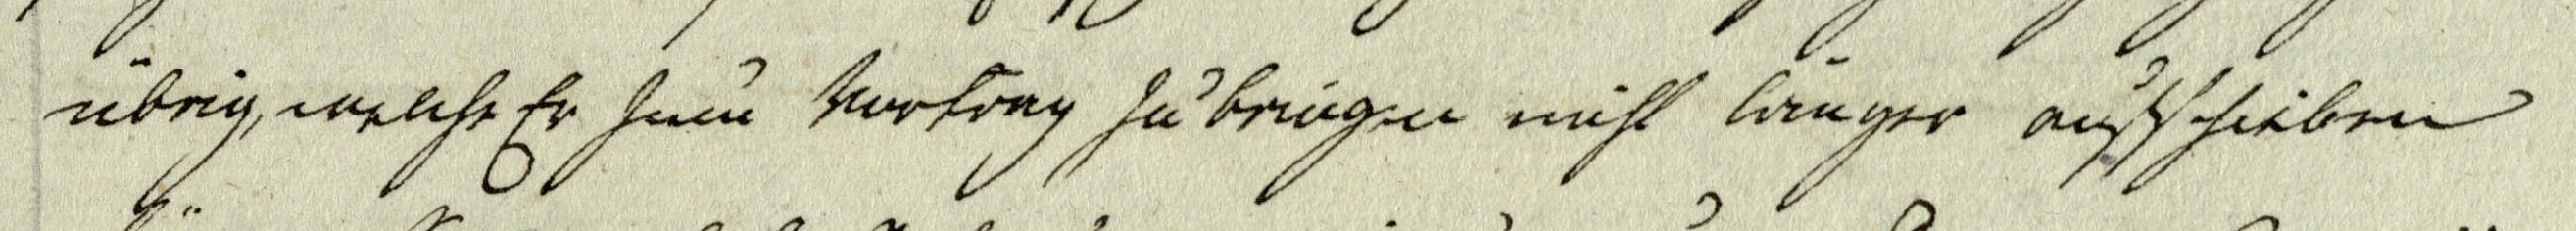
übrig, welche Er zum Vortrag zu bringen nicht länger aufschieben
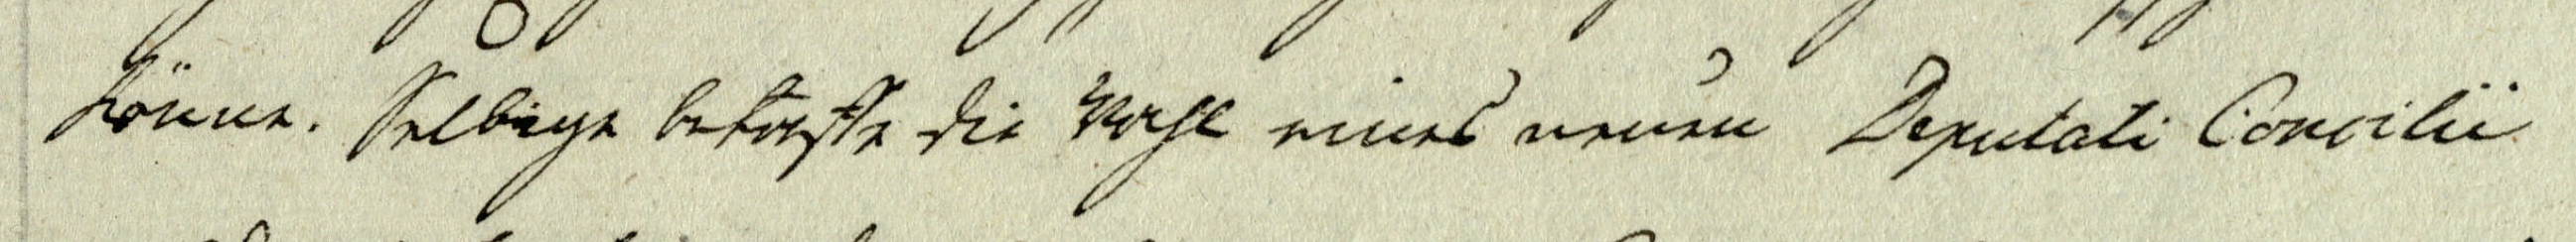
könne. Selbige betreffe die Wahl eines neuen Deputati Concilii
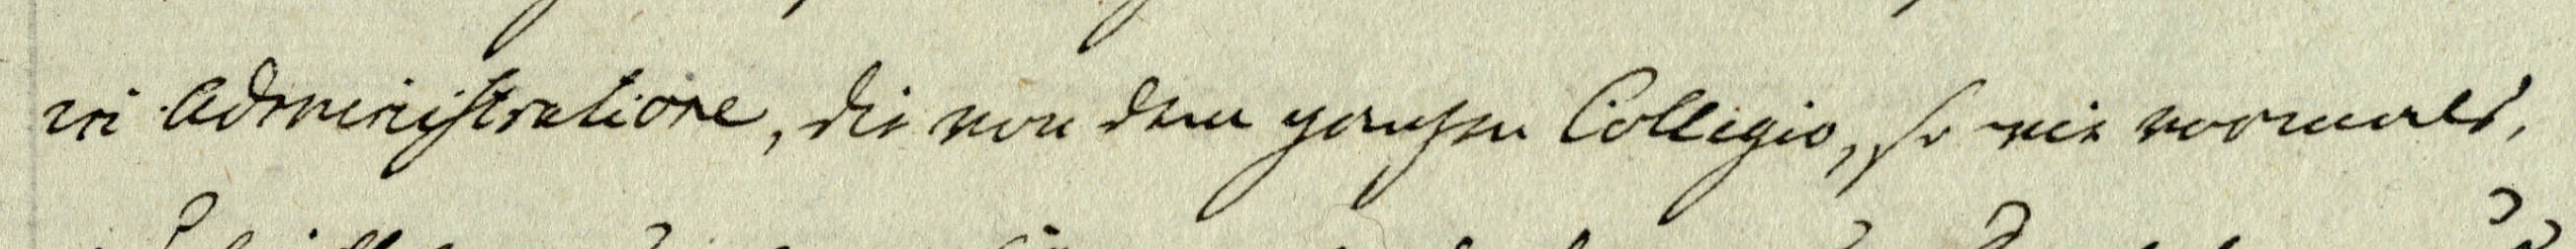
in Administratione, die von dem ganzen Collegio, so wie vormals,
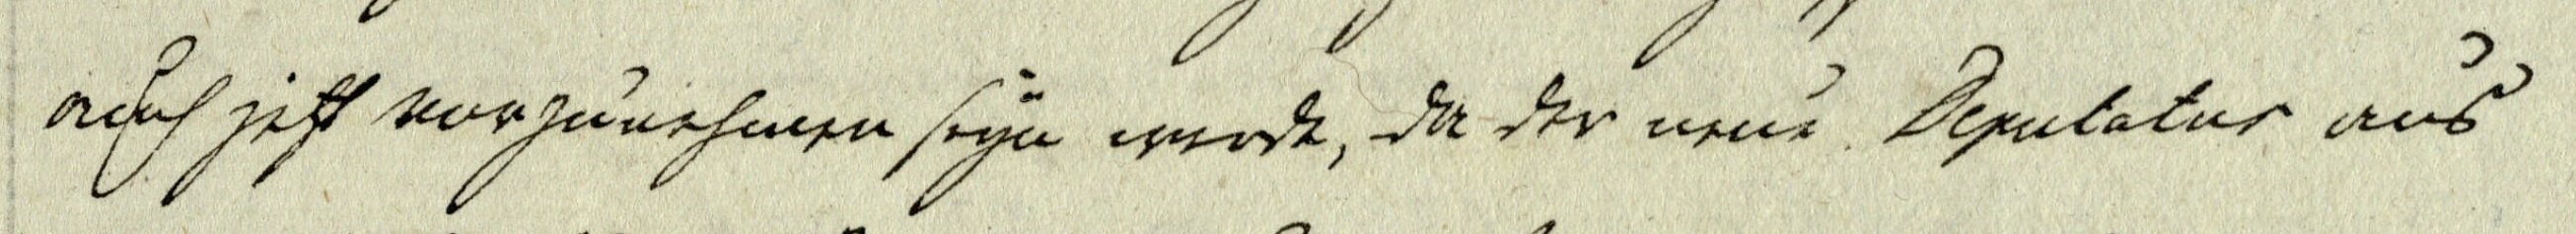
auch jetzt vorzunehmen seÿn werde, da der neue Deputatus aus
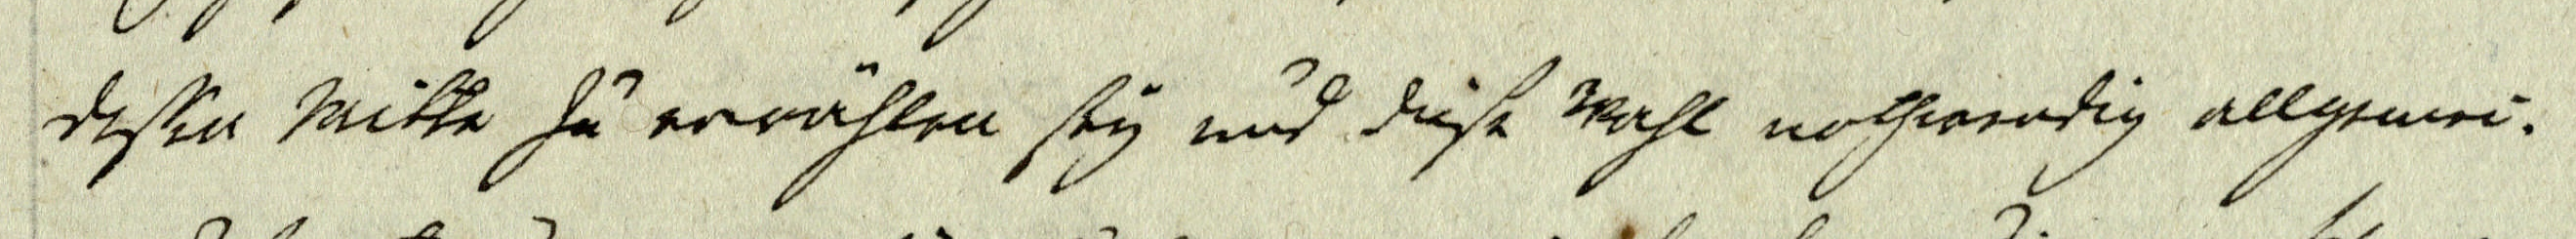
dessen Mitte zu erwählen seÿ und diese Wahl nothwendig allgemei¬
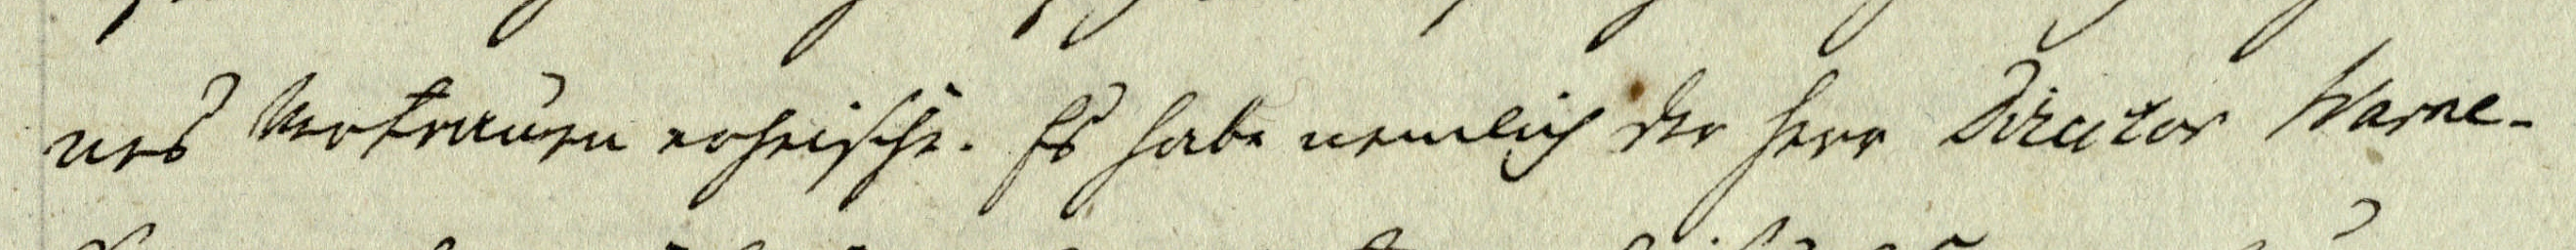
nes Vertrauen erheische. Es habe nemlich der Herr Director Warne¬
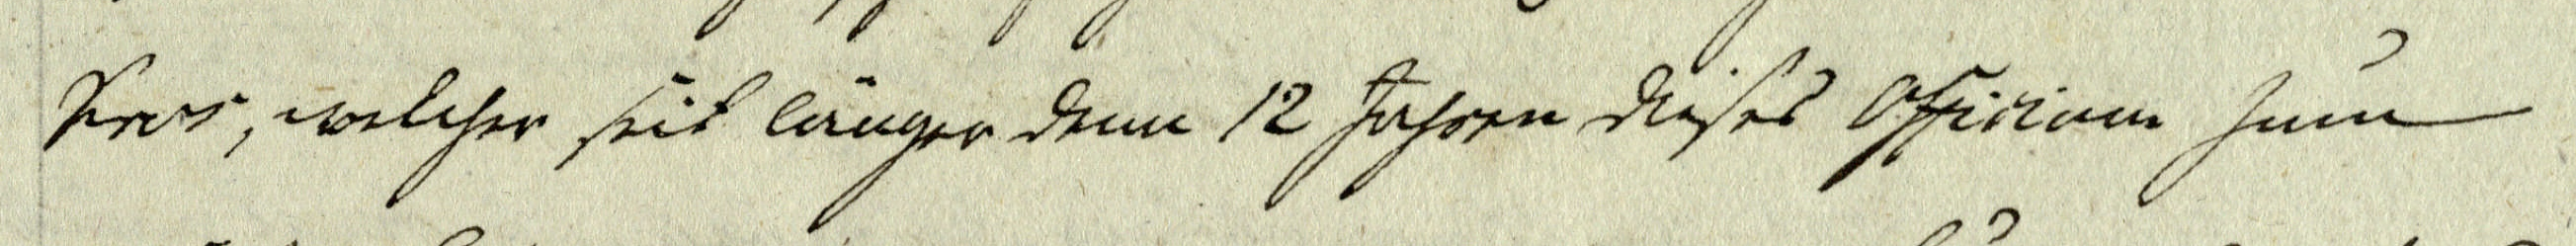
kros, welcher seit länger denn 12 Jahren dieses Officium zum
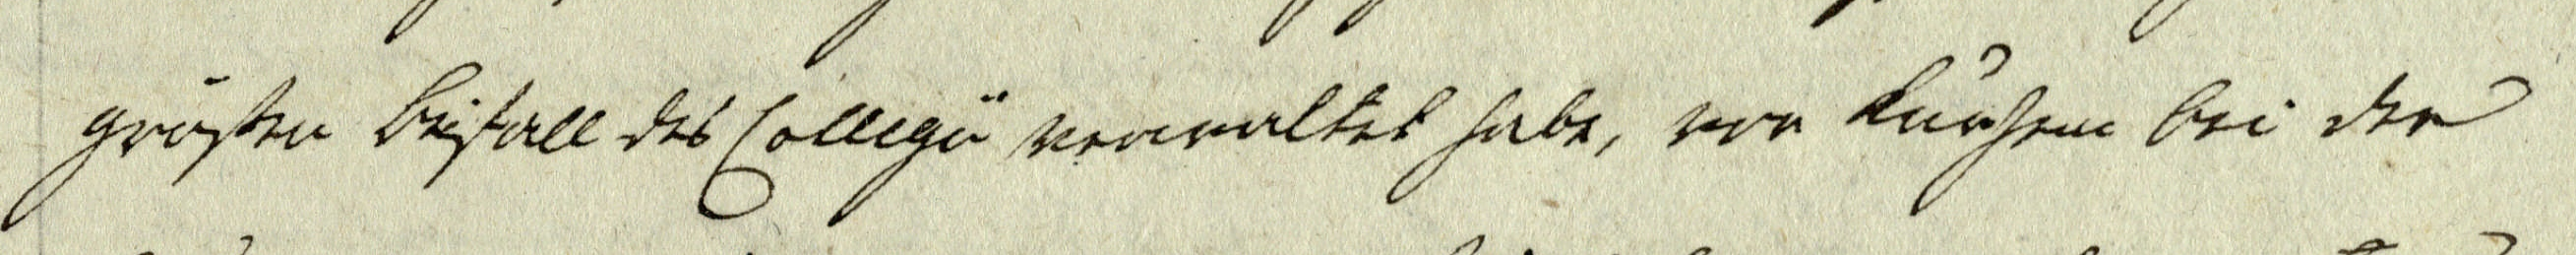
grösten Beifall des Collegii verwaltet habe, vor kurzem bei der
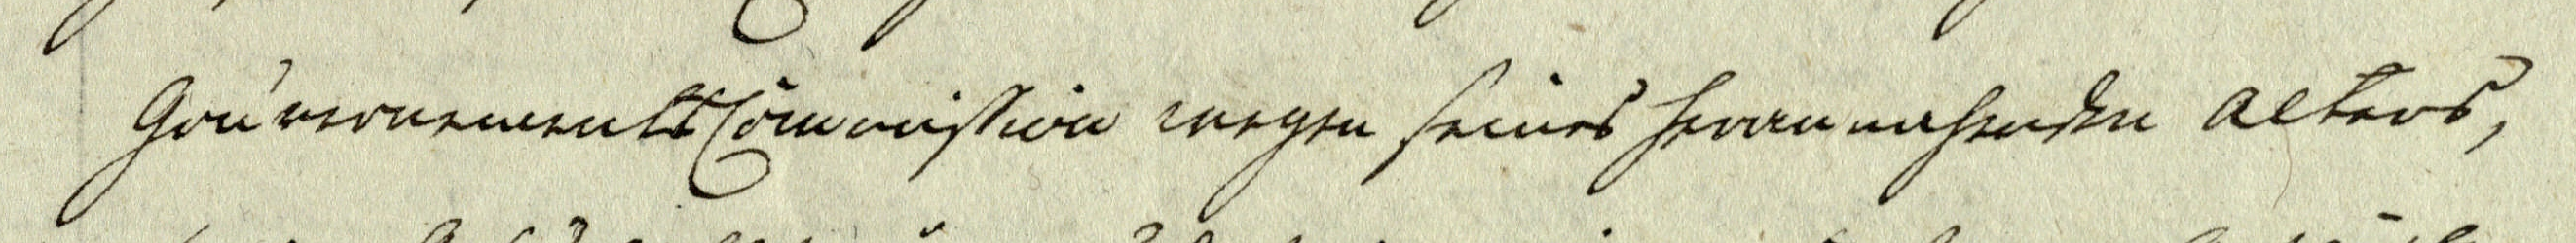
GouvernementsCommission wegen seines heran nahenden Alters,
